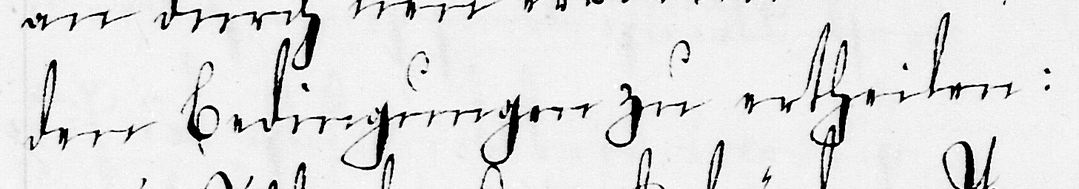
den Bedingungen zu ertheilen:
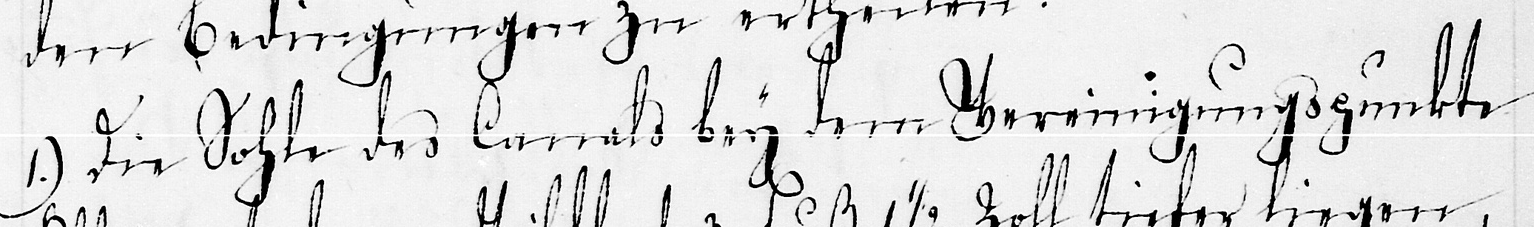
1.) Die Sohle des Canals bey dem Vereinigungspunkte
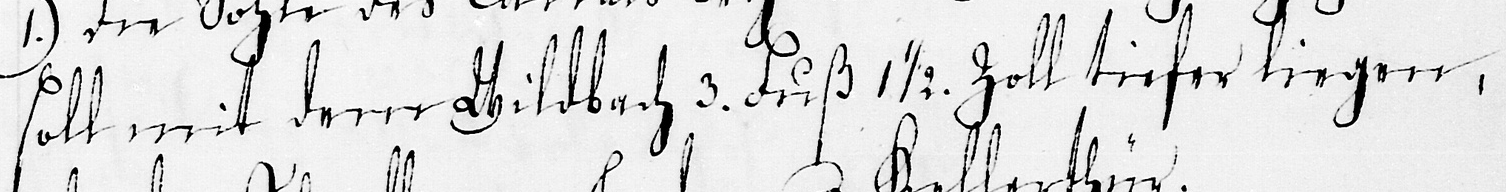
soll mit dem Wildbach 3. Fuß 1 1/2. Zoll tiefer liegen,
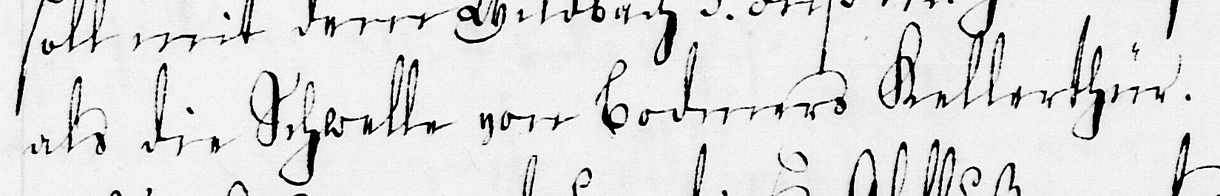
als die Schwelle von Bodmers Kellerthür.
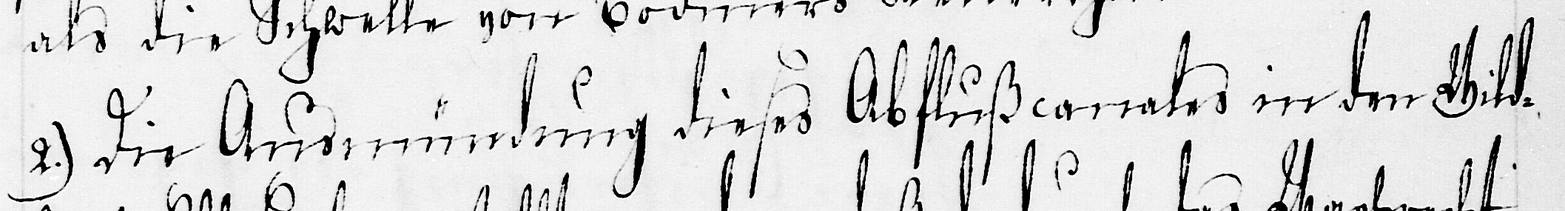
2.) Die Ausmündung dieses Abflußcanales in den Wild¬
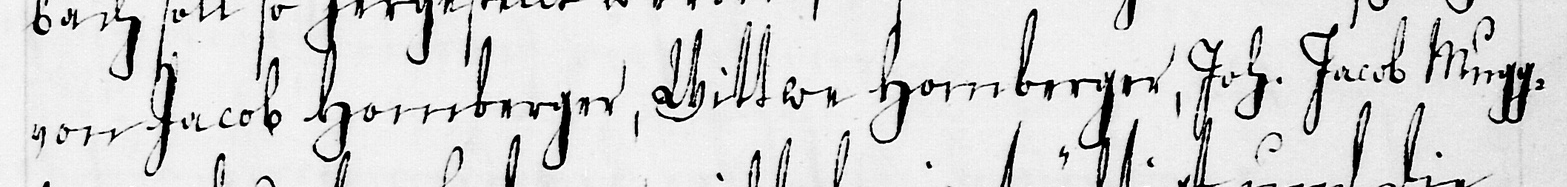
von Jacob Homberger, Wittwe Homberger, Joh. Jacob Mugg¬
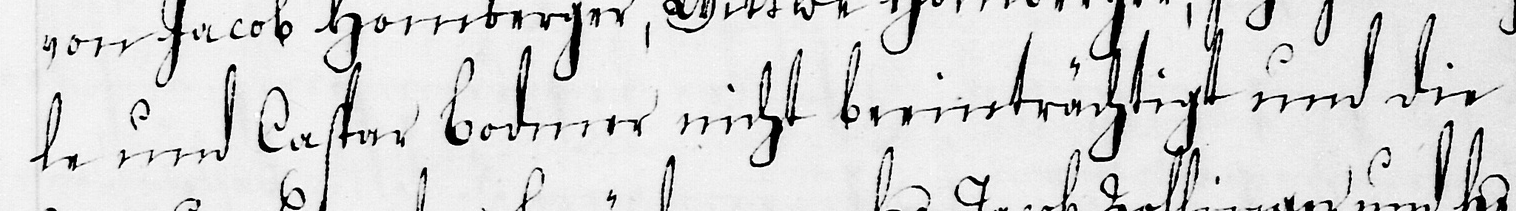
le und Caspar Bodmer nicht beeinträchtigt und die
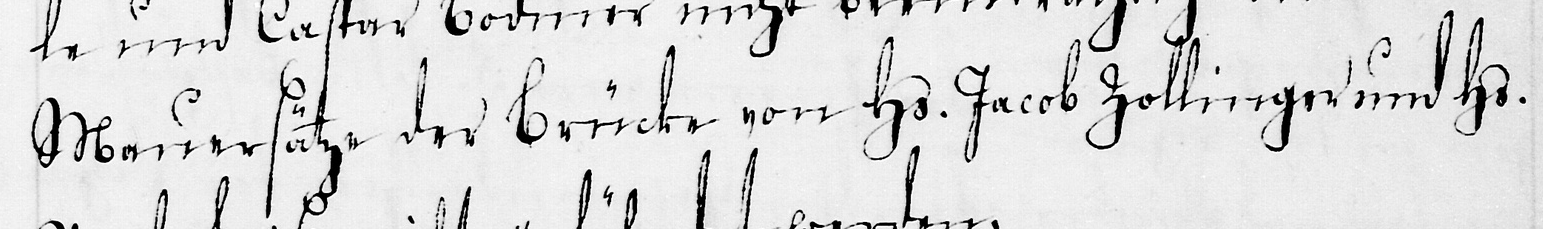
Mauersätze der Brücke von Hs. Jacob Zollinger und Hs.
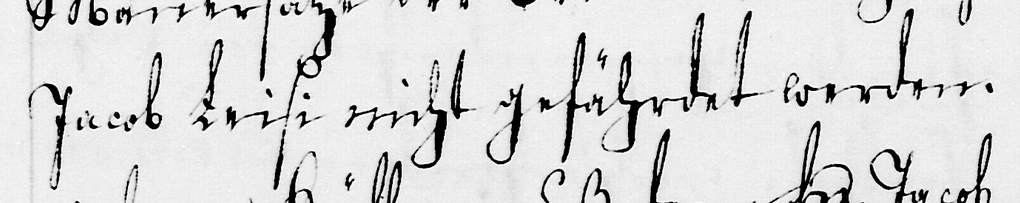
Jacob Leisi nicht gefährdet werden.
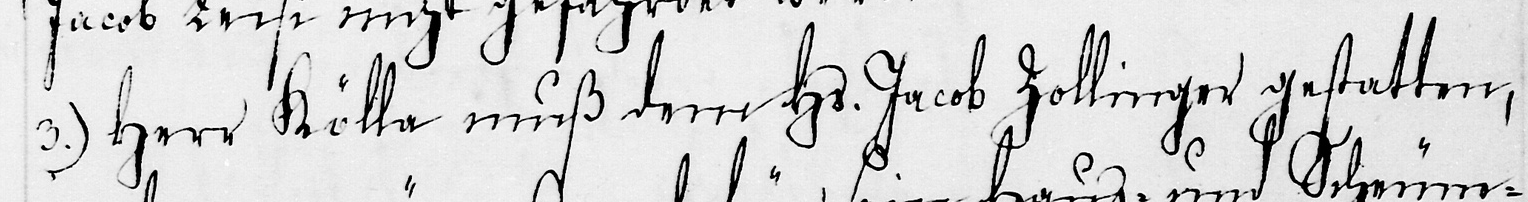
3.) Herr Kölla muß dem Hs. Jacob Zollinger gestatten,
